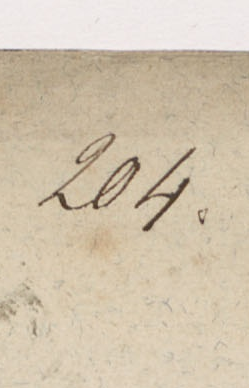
204.
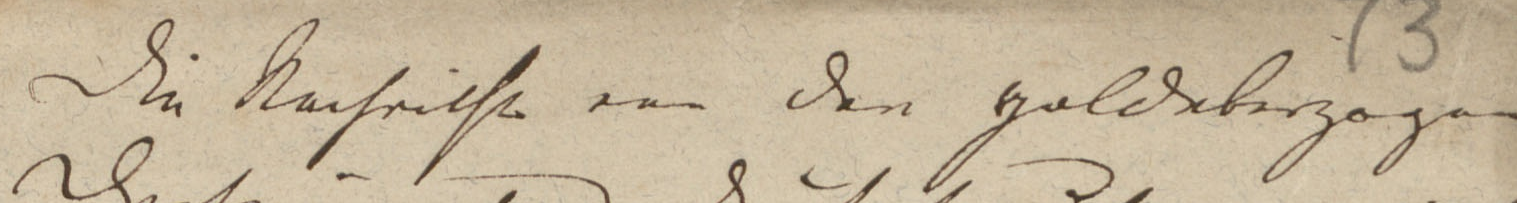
Die Nachricht von den golduberzogenen
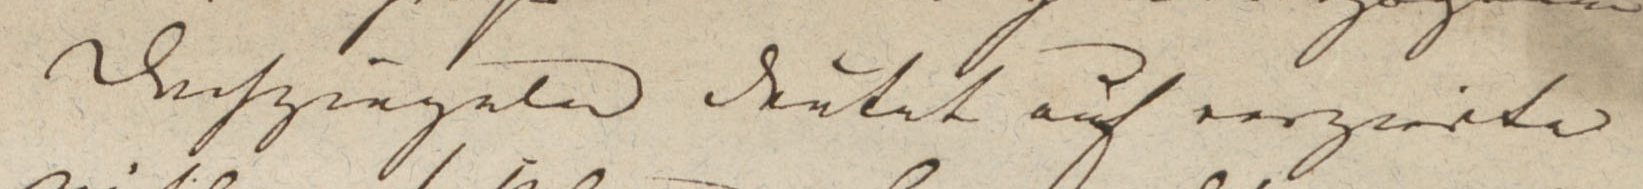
Dachziegeln deutet auf verzierte
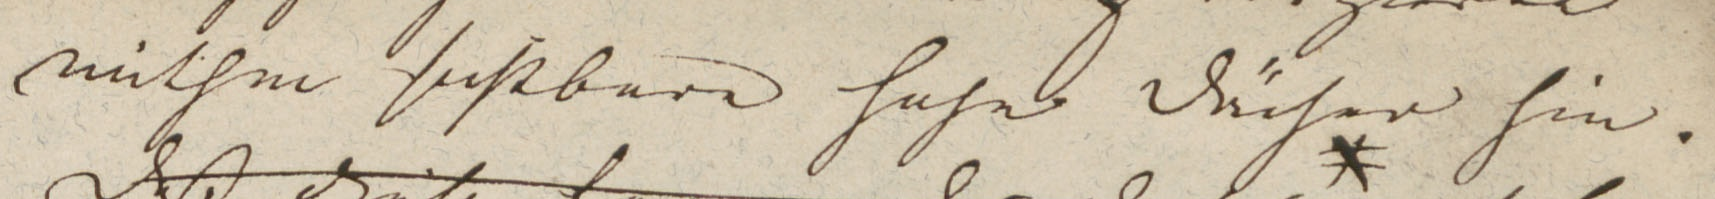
mithin sichtbare hohe Dächer hin.
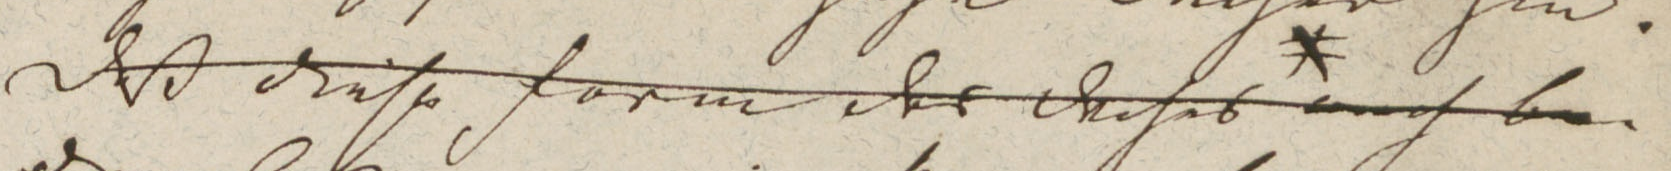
Dass diese Form des Daches % noch bei
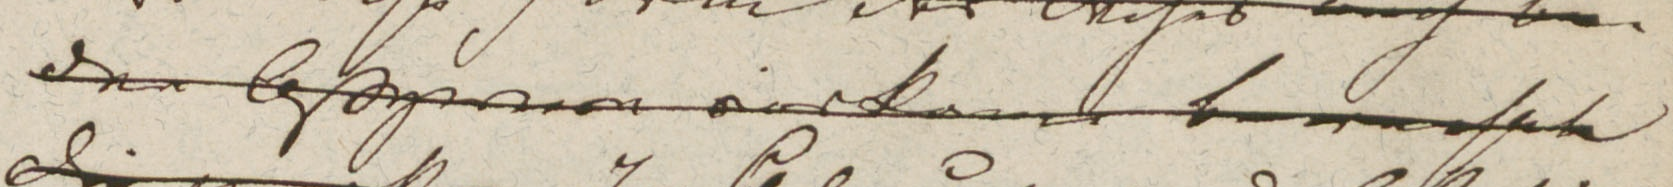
den Assyriern vorkam beweisete
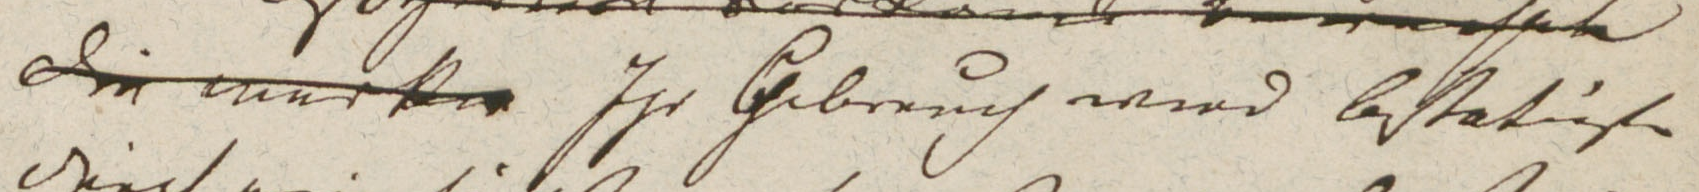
die merkw Ihr Gebrauch wird bestatigt
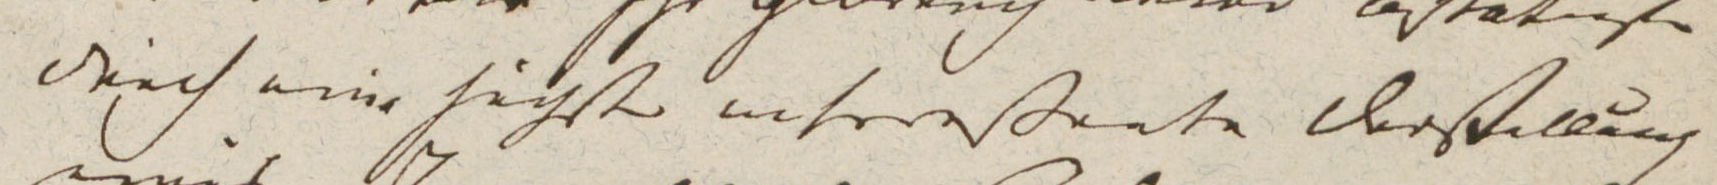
durch eine höchst interessante Darstellung
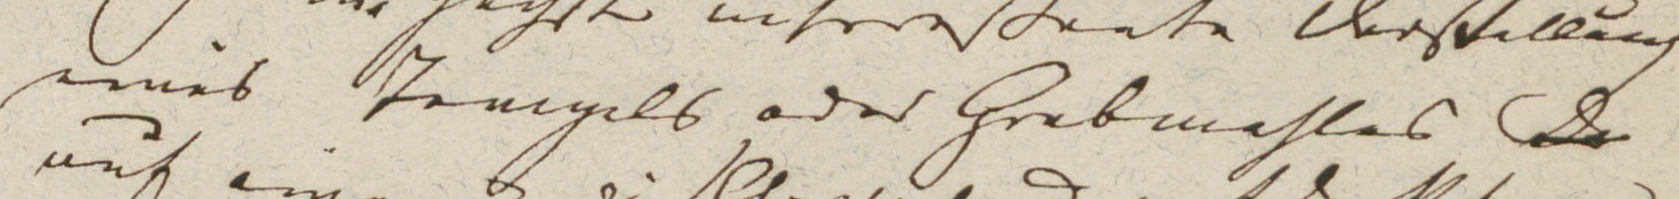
eines Tempels oder Grabmahles da
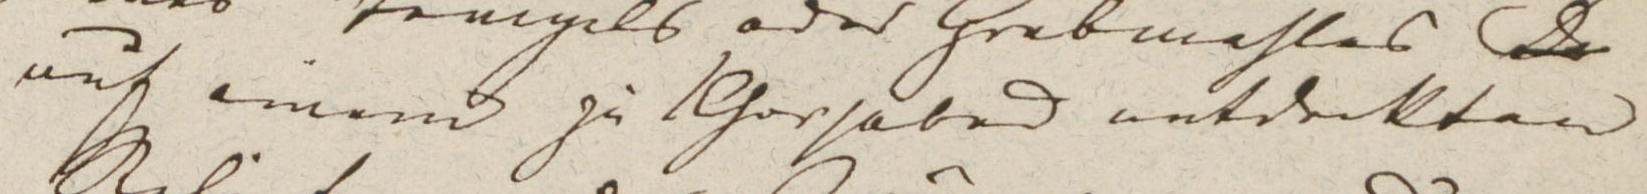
auf einem zu Khorsabad entdeckten
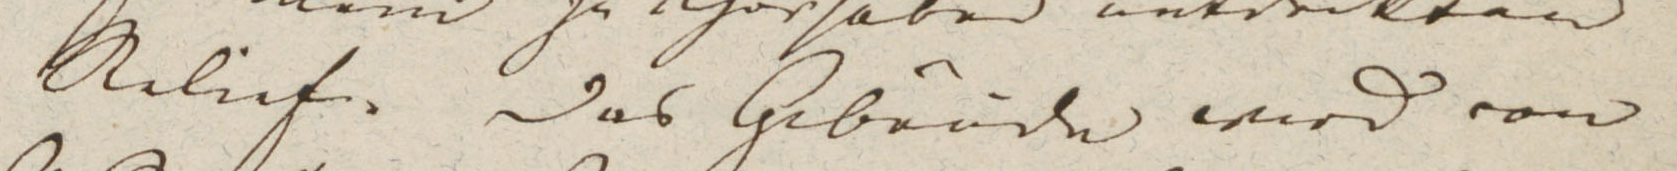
Relief. Das Gebäude wird von
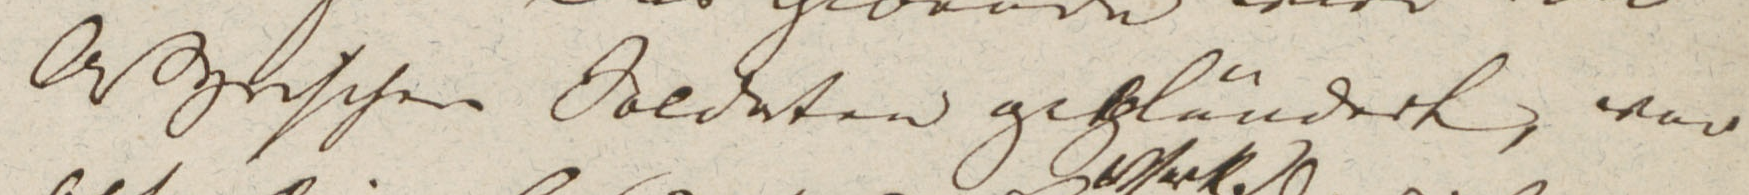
Assyrischen Soldaten geplündert, war
